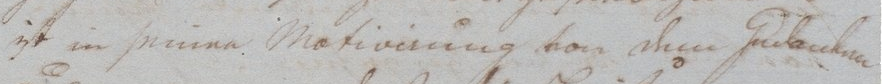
ist in seiner Motivirung von dem Gedanken
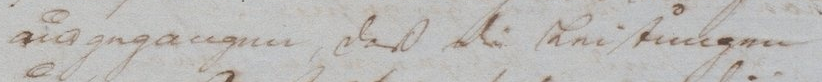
ausgegangen, daß die Leistungen
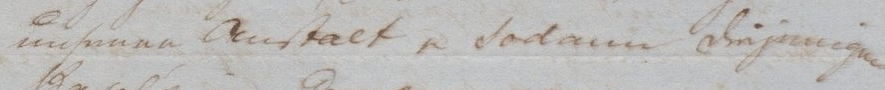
unserer Anstalt & sodann diejenigen
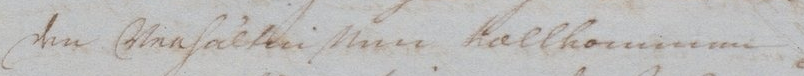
den Verhältnissen vollkommen
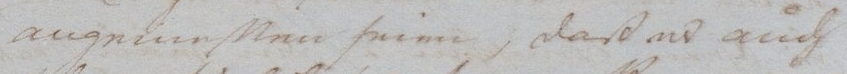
angemessen seien, daß es auch
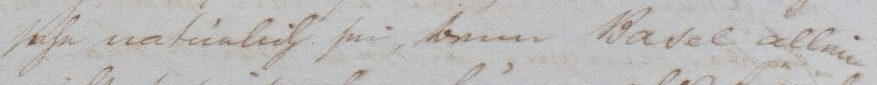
sehr natürlich sei, wenn Basel allein
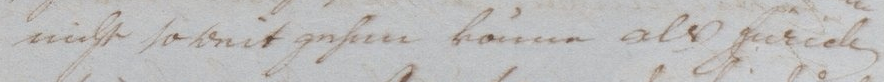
nicht soweit gehen könne als Zürich
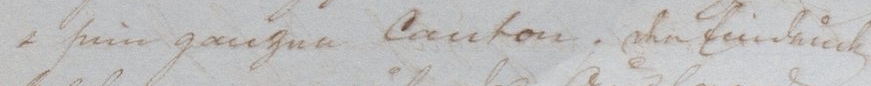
& sein ganzer Canton. Der Eindruck
